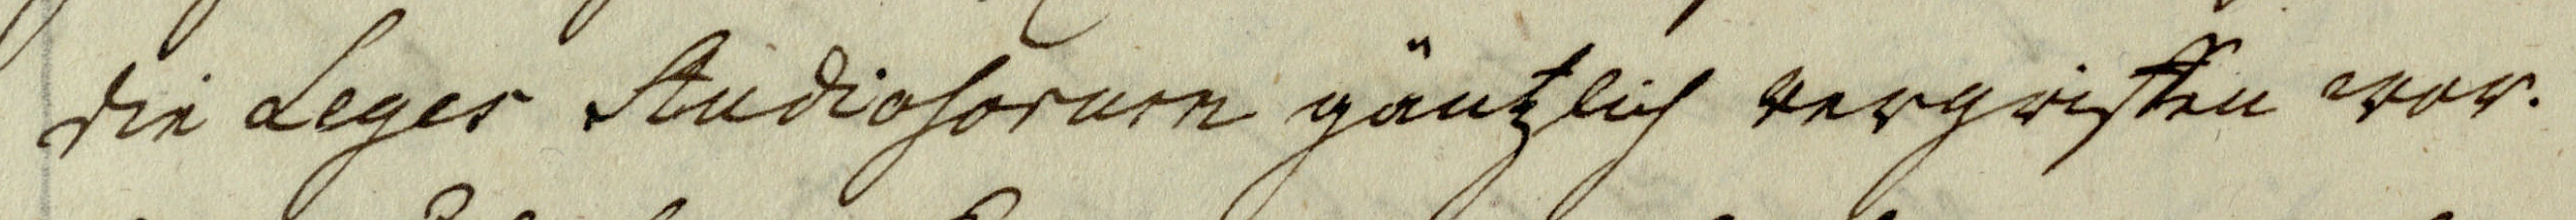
die Leges Studiosorum gäntzlich vergriffen wor¬
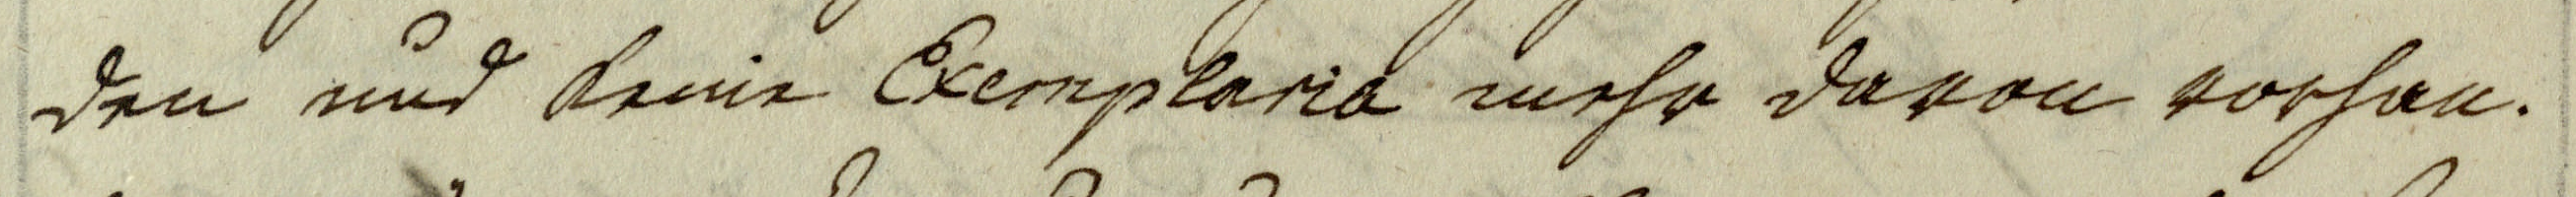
den und keine Exemplaria mehr davon vorhan¬
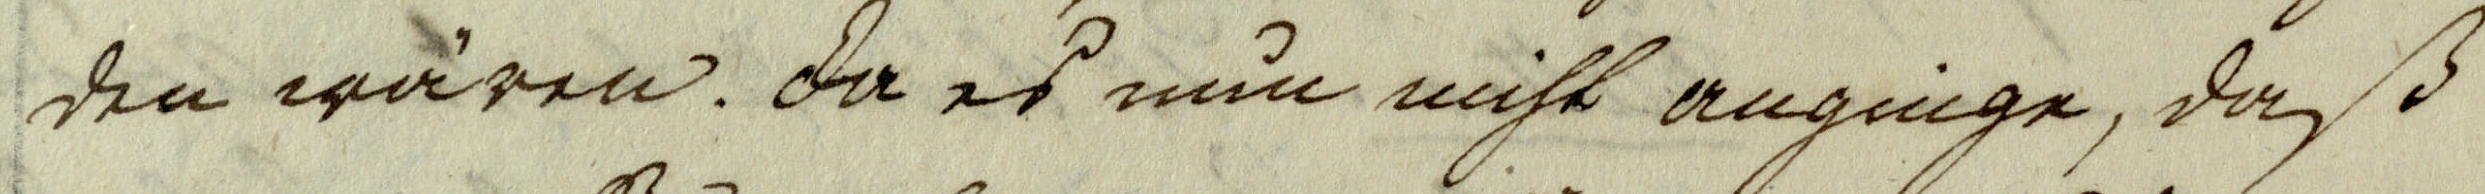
den wären. Da es nun nicht anginge, daß
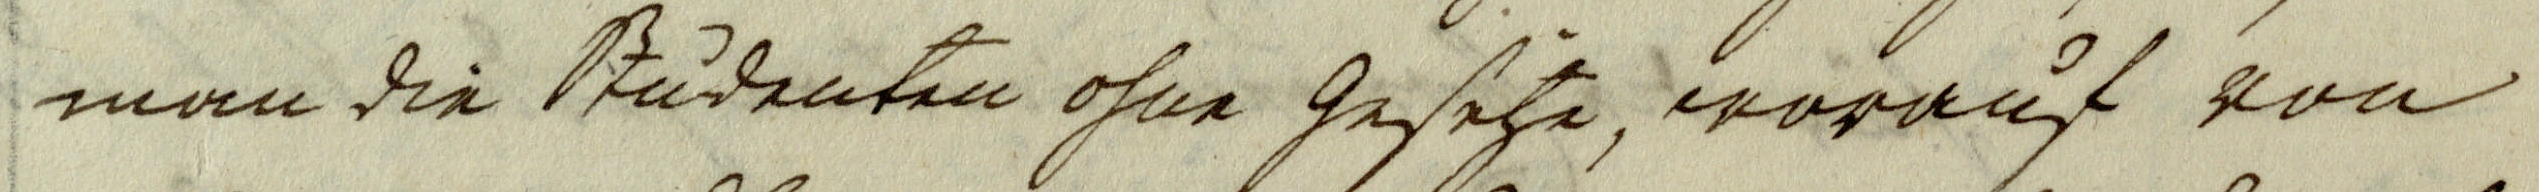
man die Studenten ohne Gesetze, worauf von
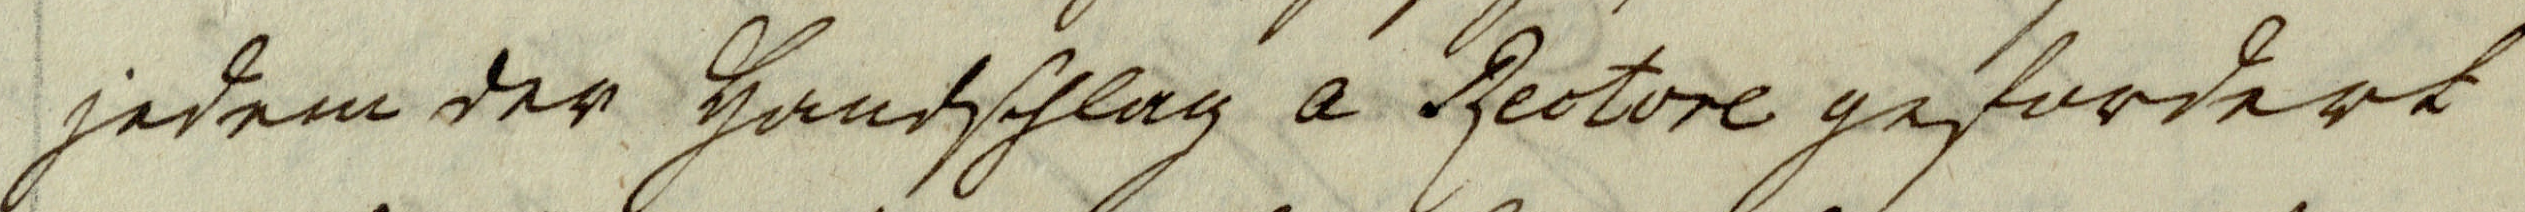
jedem der handschlag a Rectore gefordert
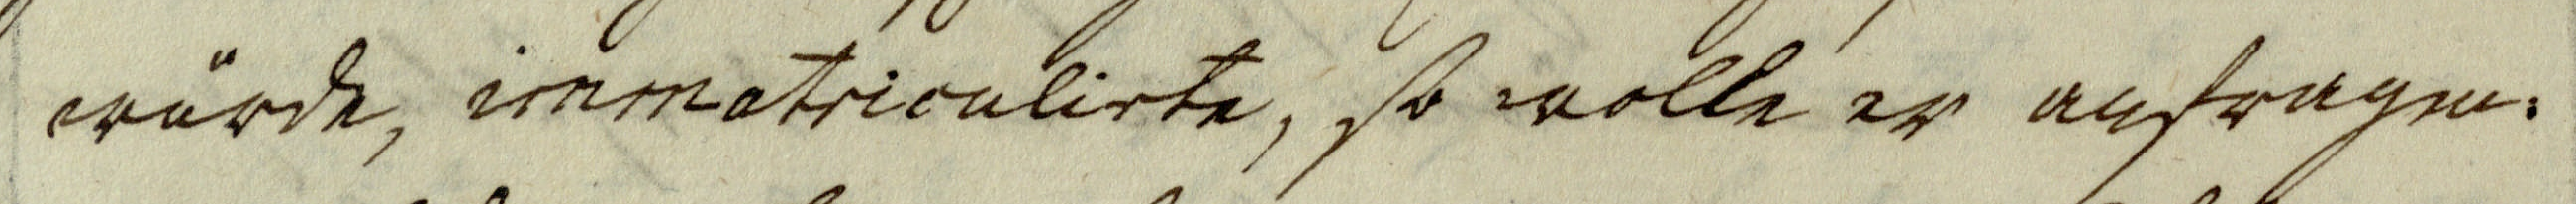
würde, immatriculirte, so wolle er anfragen:
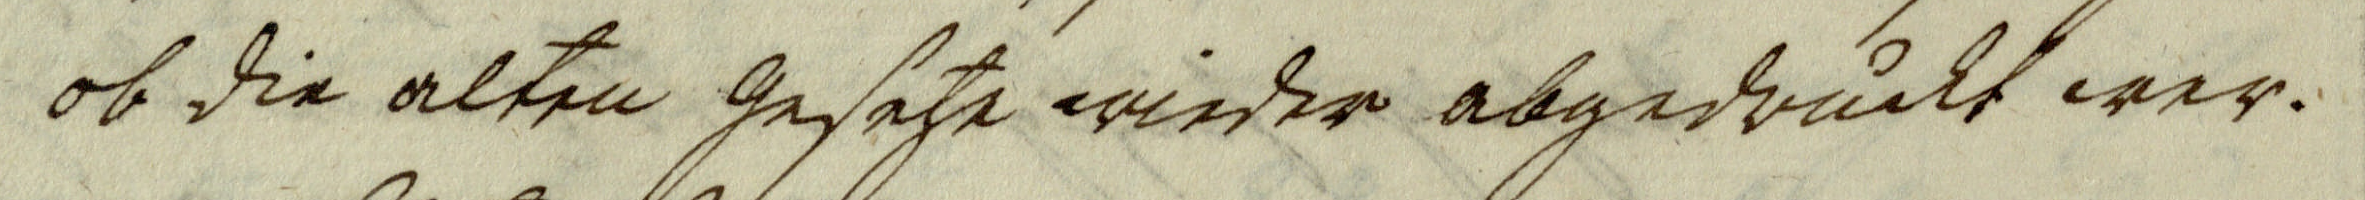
ob die alten Gesetze wieder abgedruckt wer¬
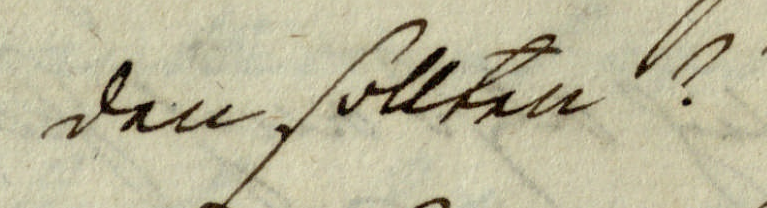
den sollten?
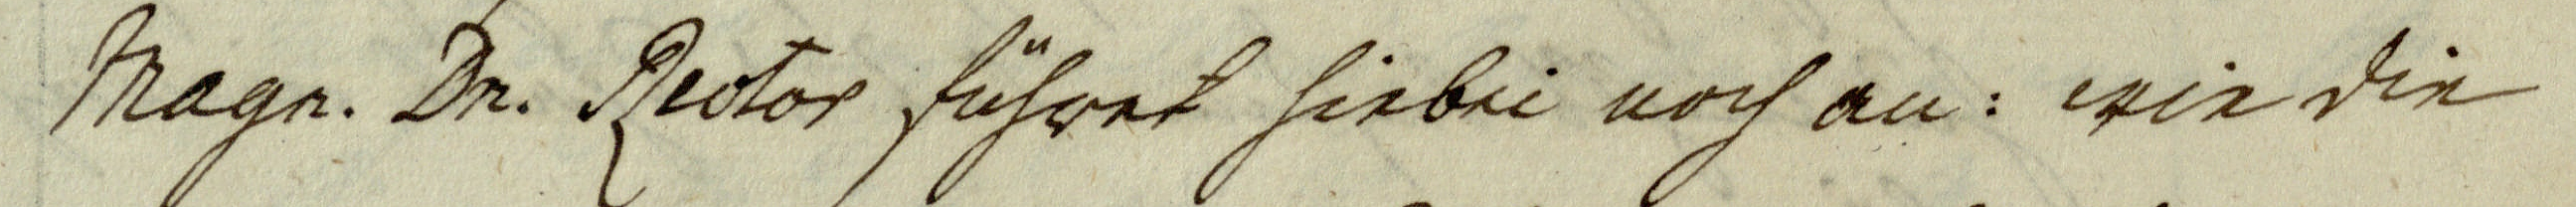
Magn. Dn. Rector führet hiebei noch an: wie die
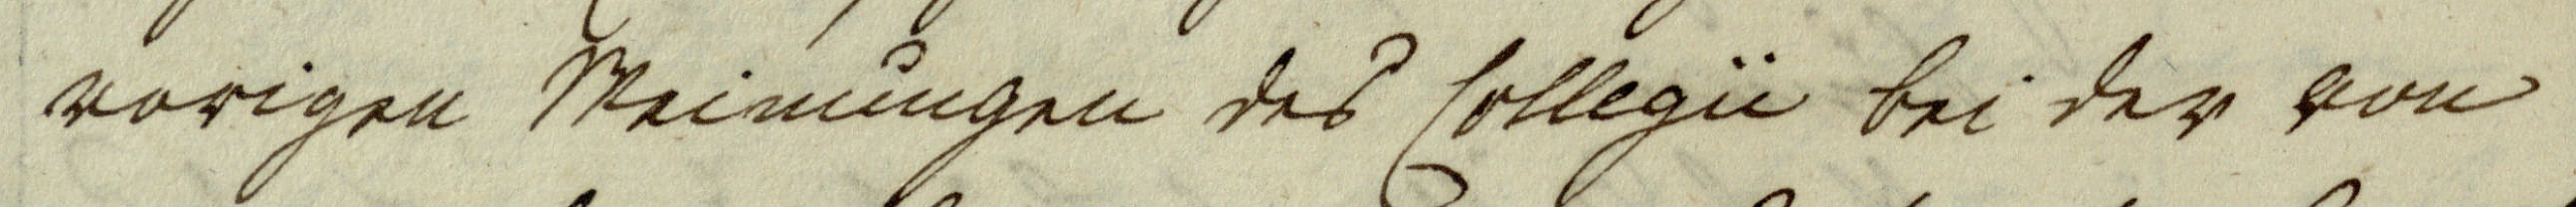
vorigen Meinungen des Collegii bei der von
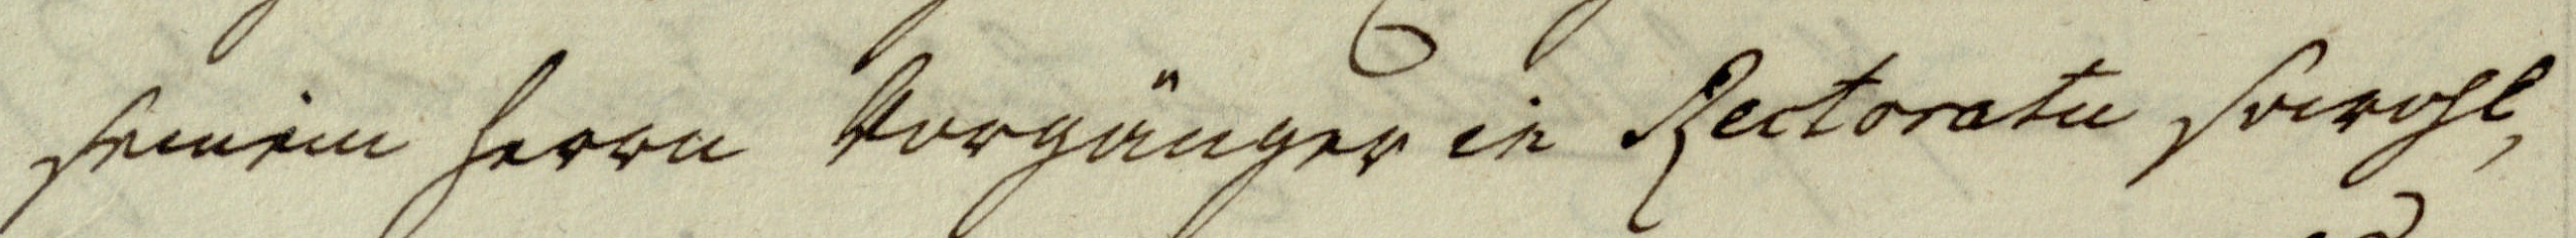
seinem Herrn Vorgänger in Rectoratu sowohl,
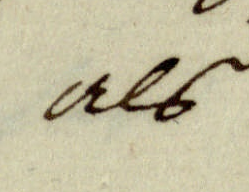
als
